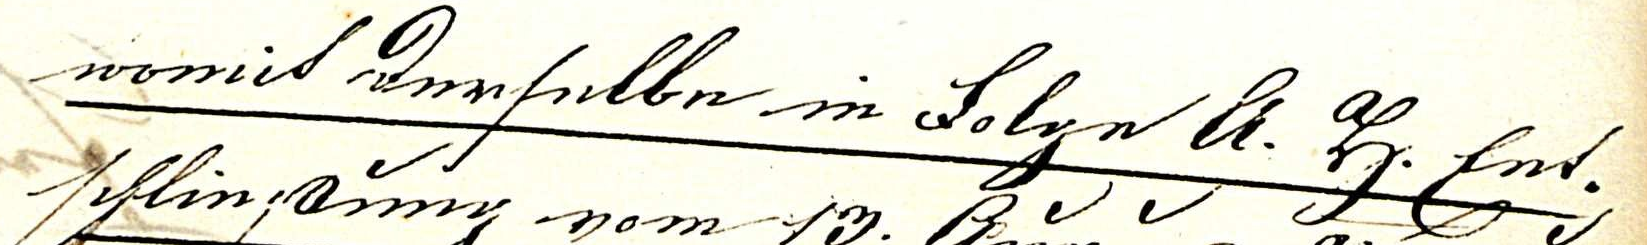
womit derselbe in Folge A. H. Ent¬
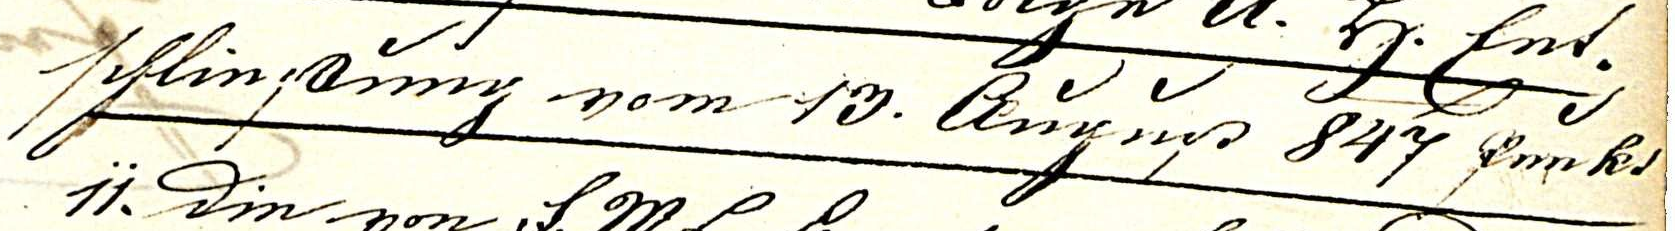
schließung vom 13. August 847 Punks
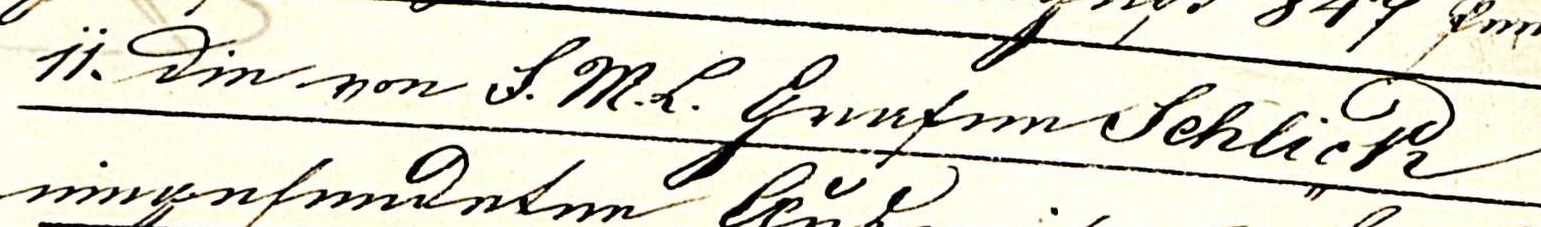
11. Die von F. M. L. Grafen Schlick
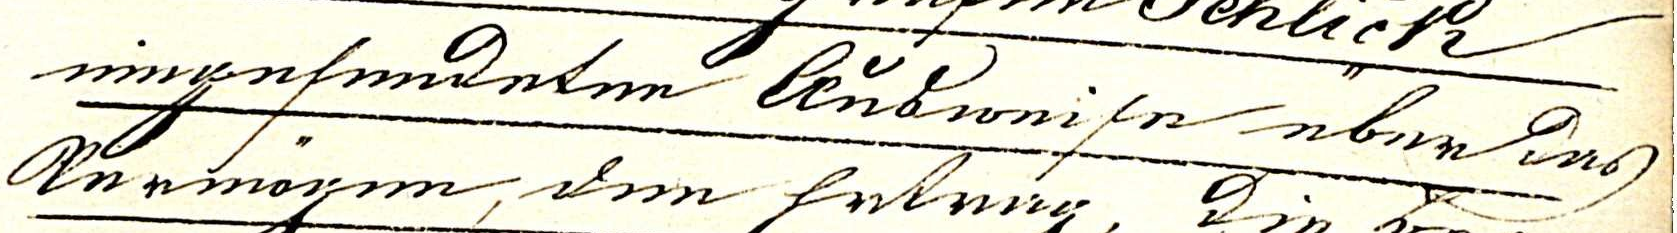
eingesendeten Ausweise über des
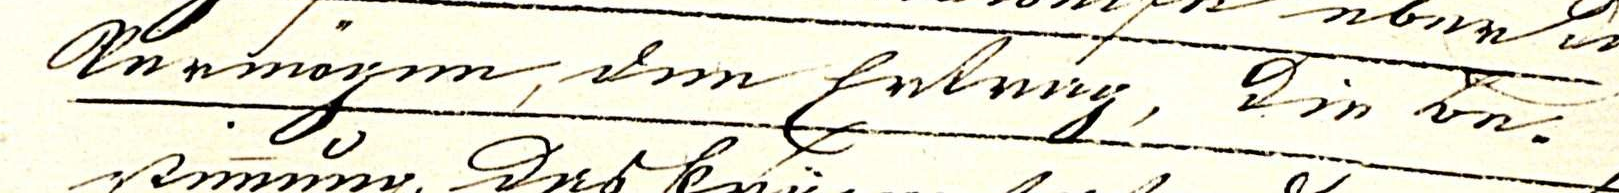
Vermögen, dem Ertrag, die Be¬
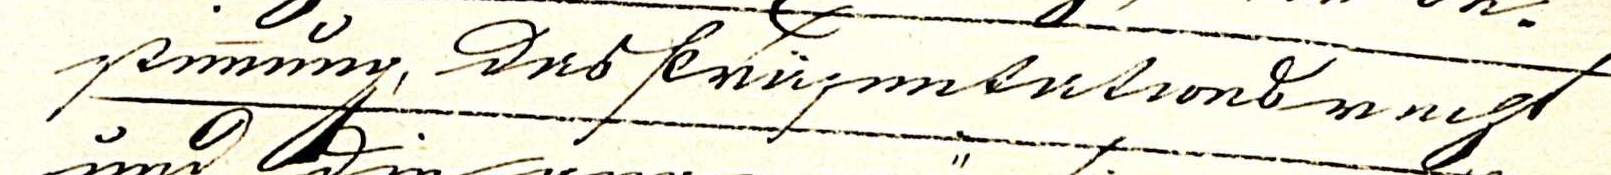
stimmung, das Präsentationsrecht
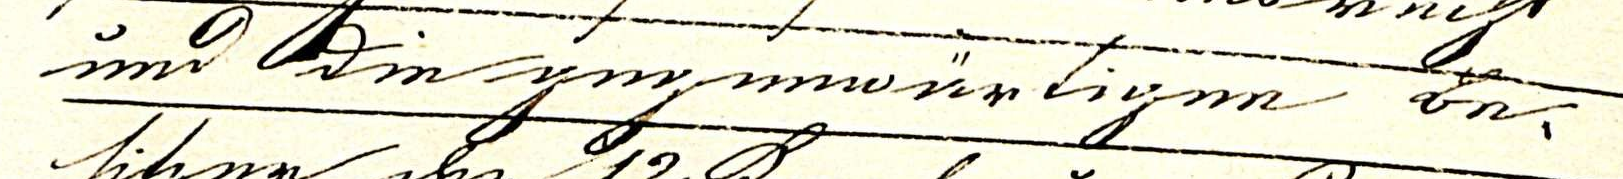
und die gegenwärtigen Be¬
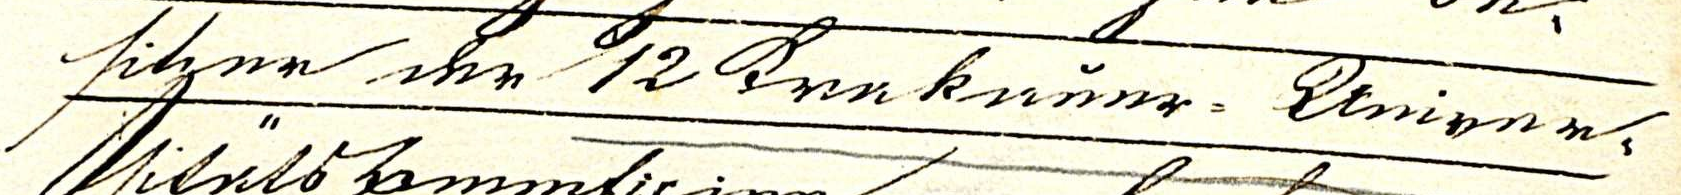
sitzer der 12 Krakauer=Universi¬
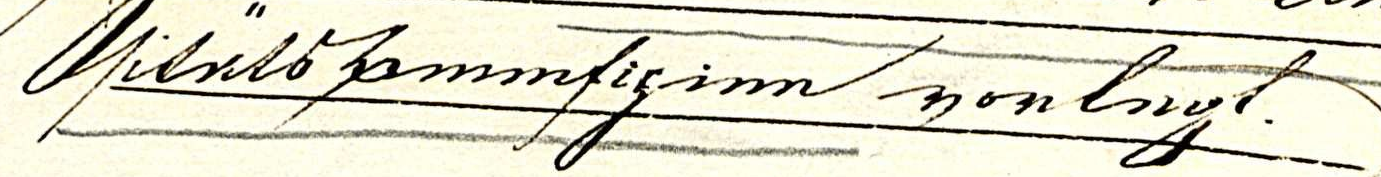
tätsxxzien vor legt.
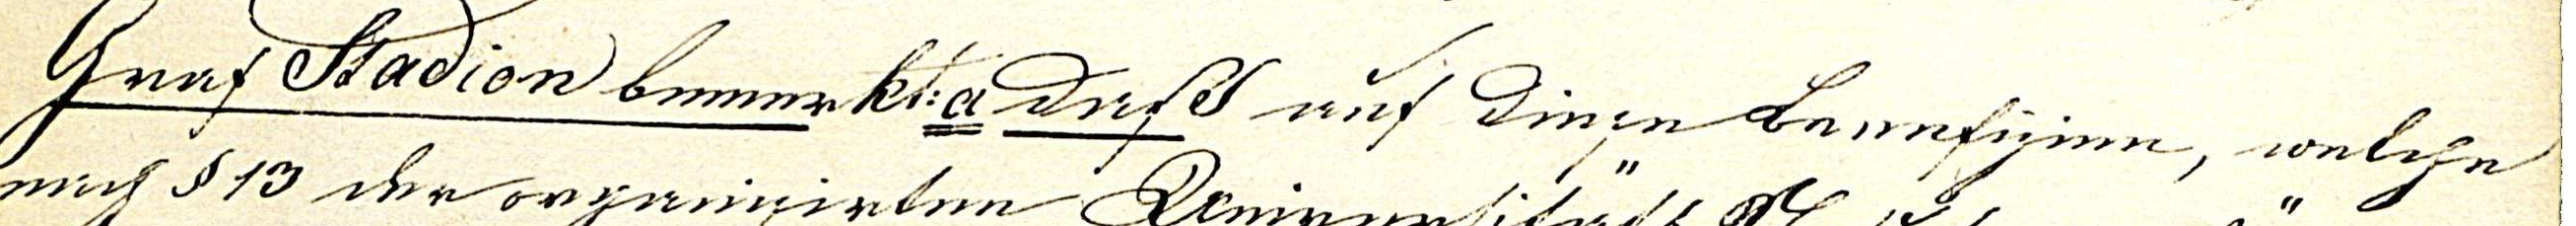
Graf Station bemerkt: a daß auf diese Benefizien, welche
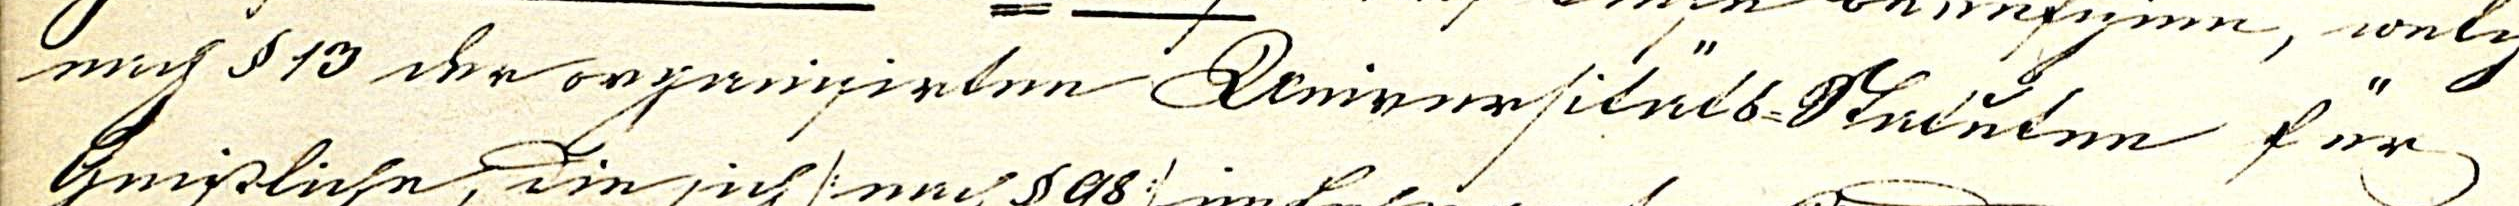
mich §13 der organisirten Universitäts=Statuten für
